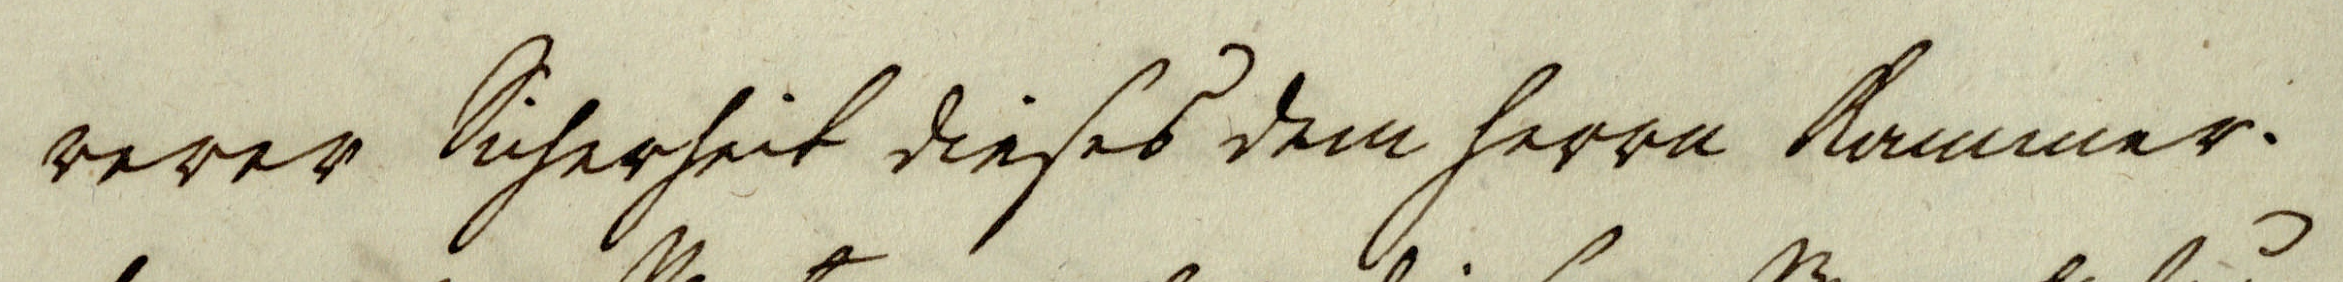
rerer Sicherheit dieses dem Herrn Kammer¬
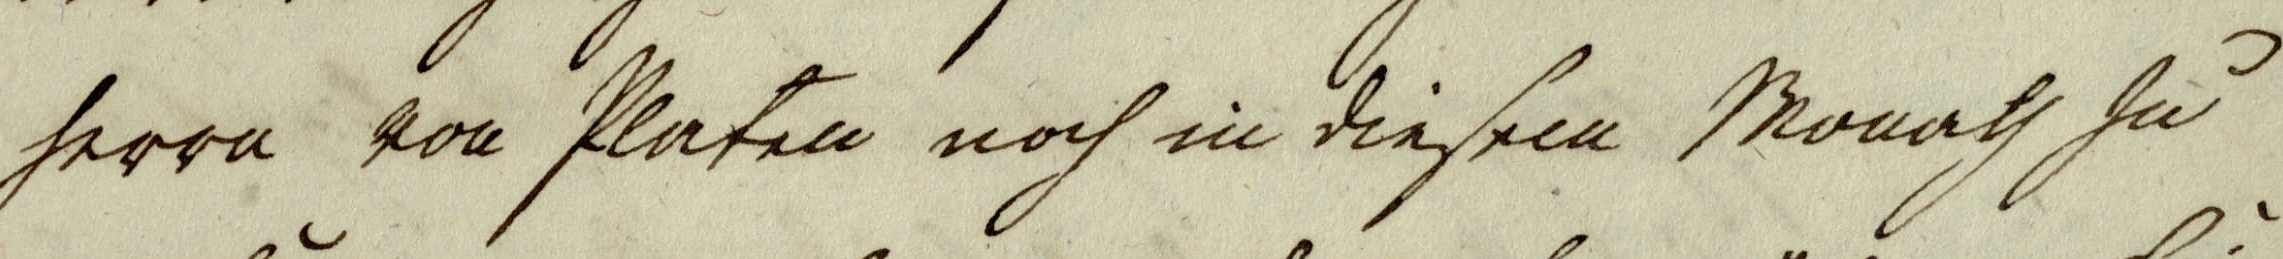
herrn von Platen noch in diesem Monath zu
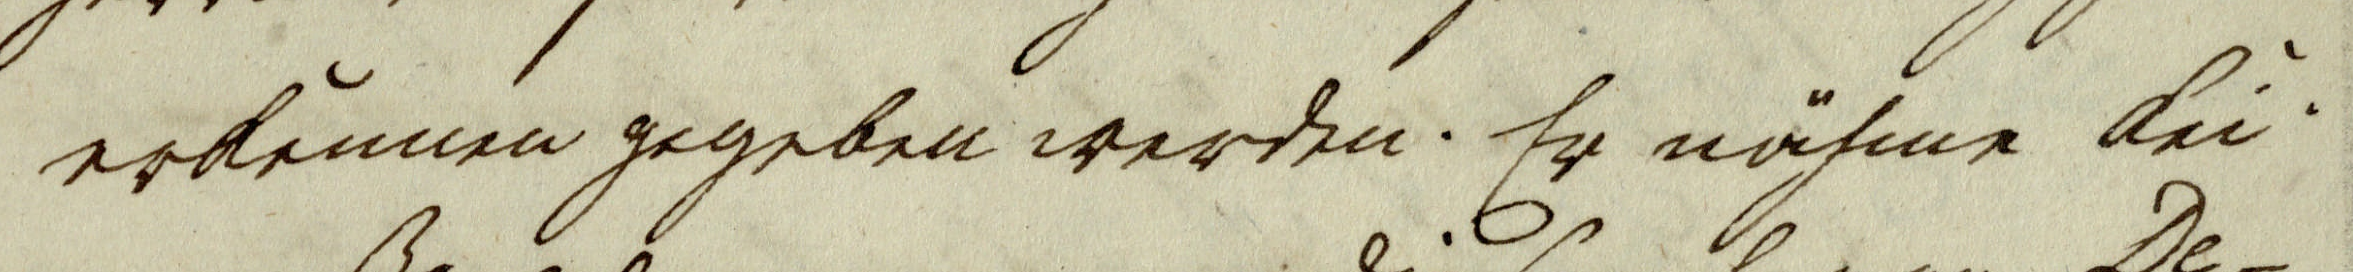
erkennen gegeben werden. Er nähme kei¬
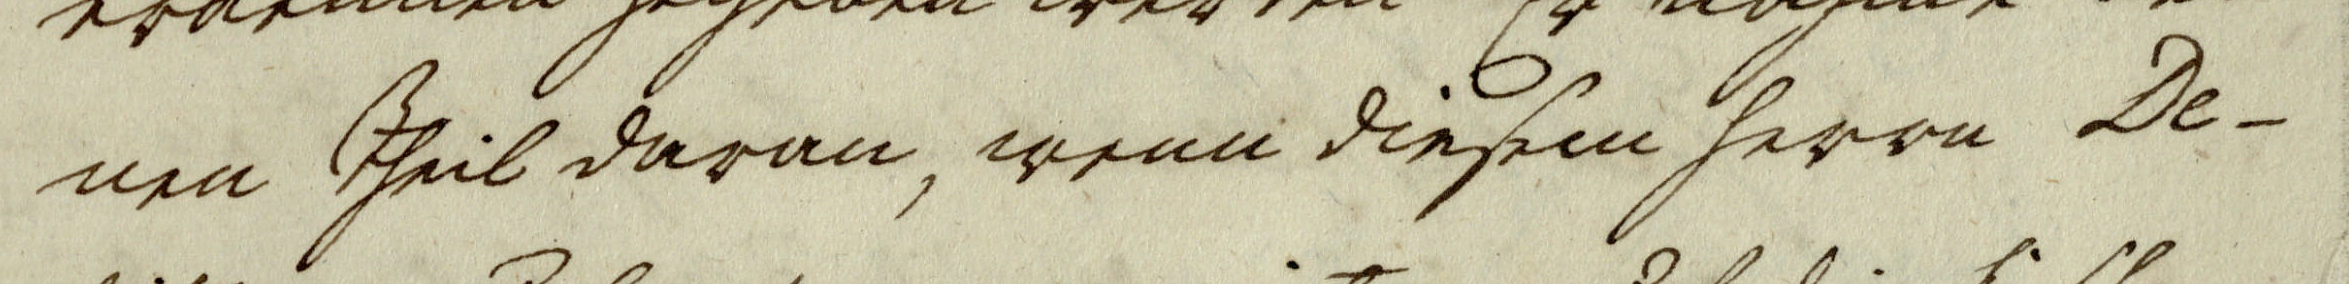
nen Theil daran, wenn diesem Herrn De¬
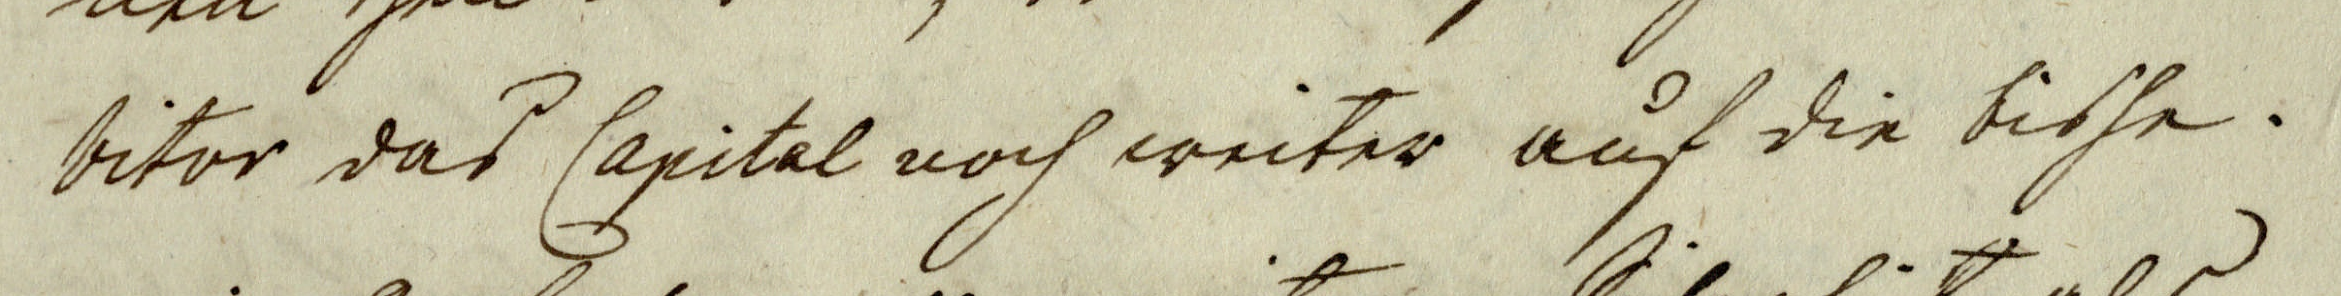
bitor das Capital noch weiter auf die bishe¬
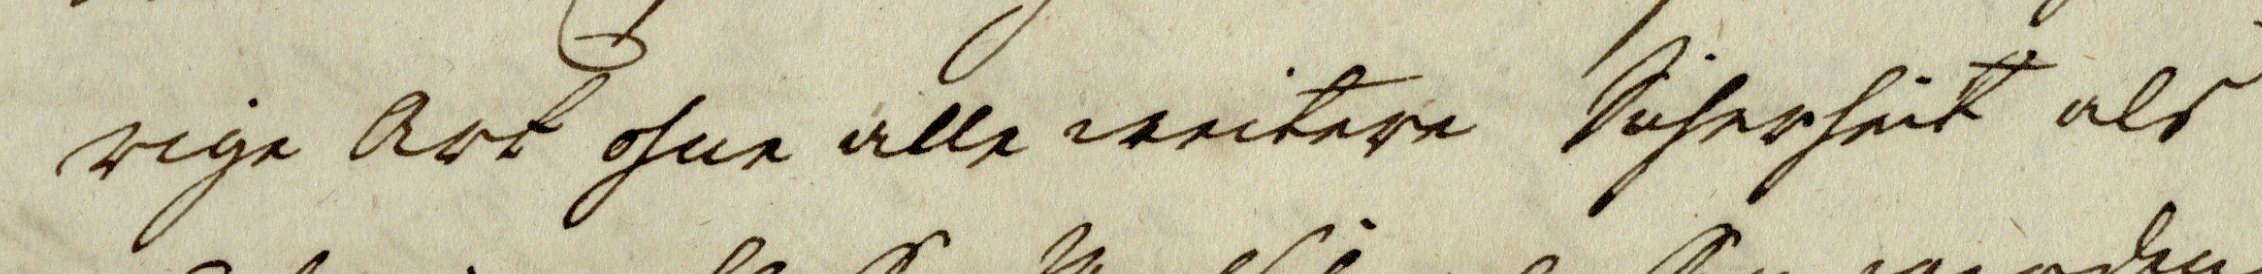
rige Art ohne alle weitere Sicherheit als
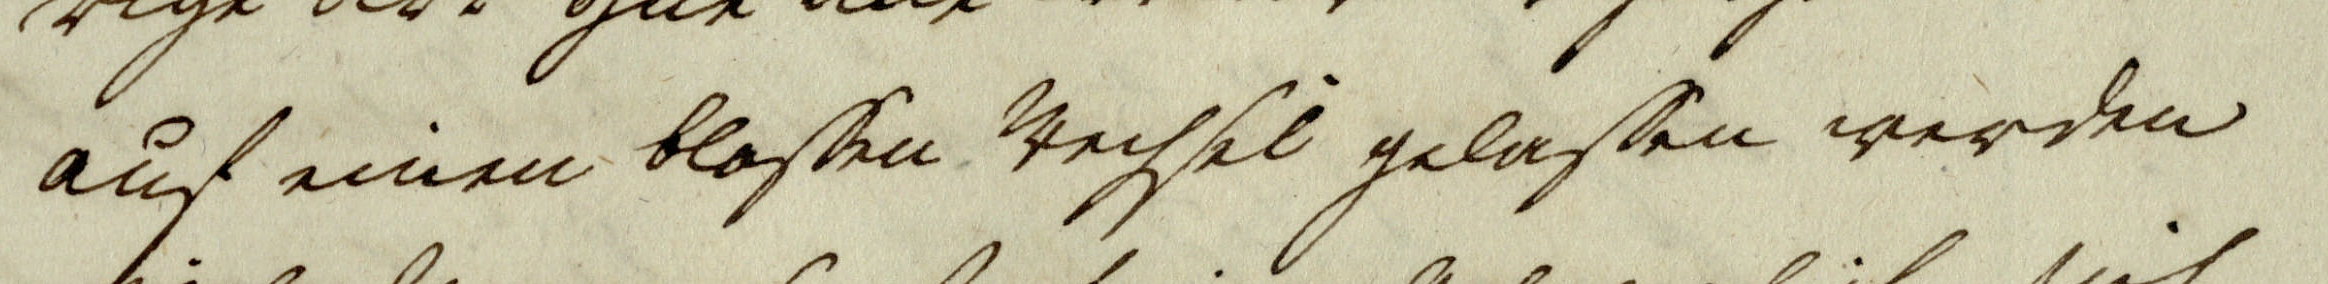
auf einen blossen Wechsel gelassen werden
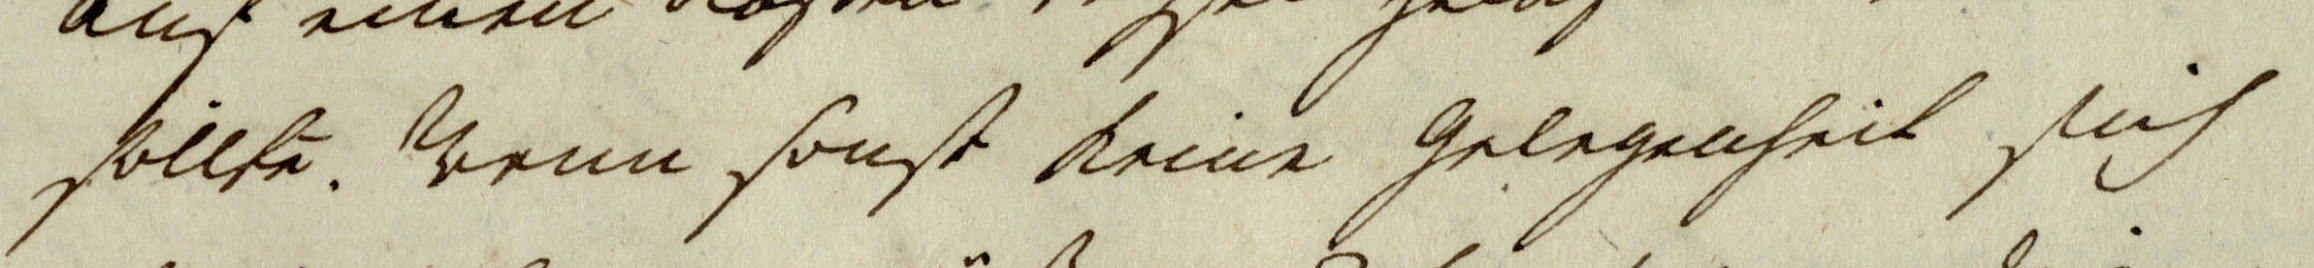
sollte. Wenn sonst keine Gelegenheit sich
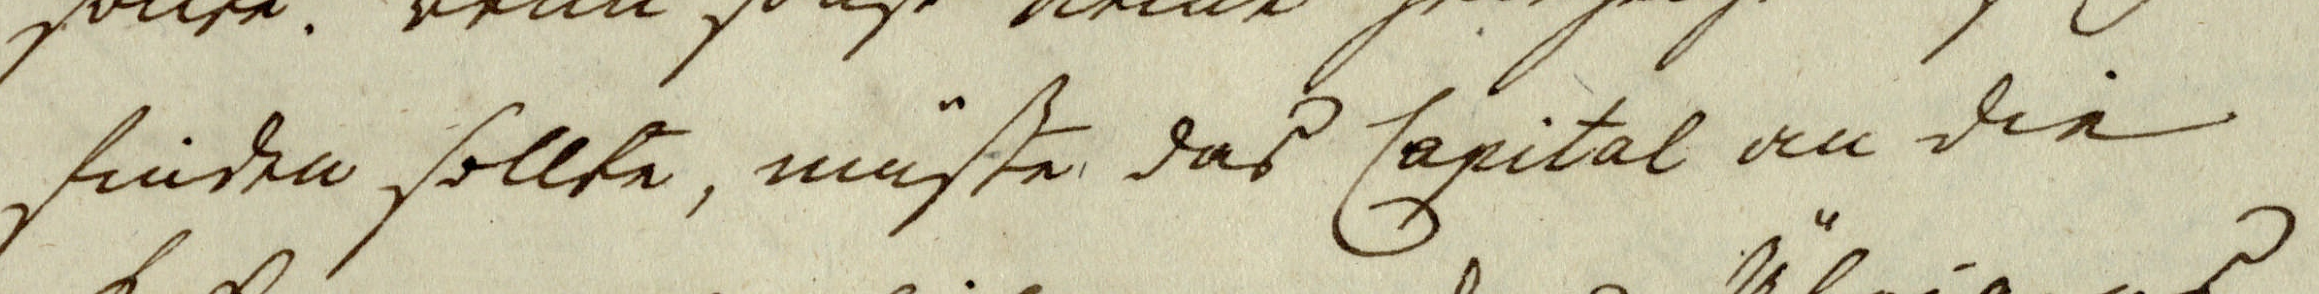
finden sollte, müßte das Capital an die
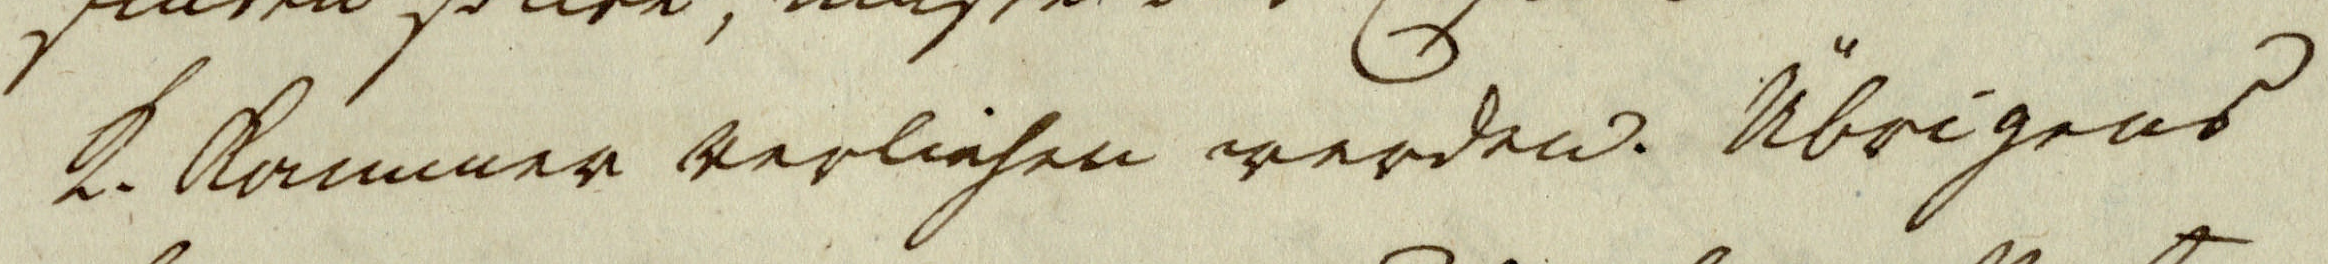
K. Kammer verliehen werden. Übrigens
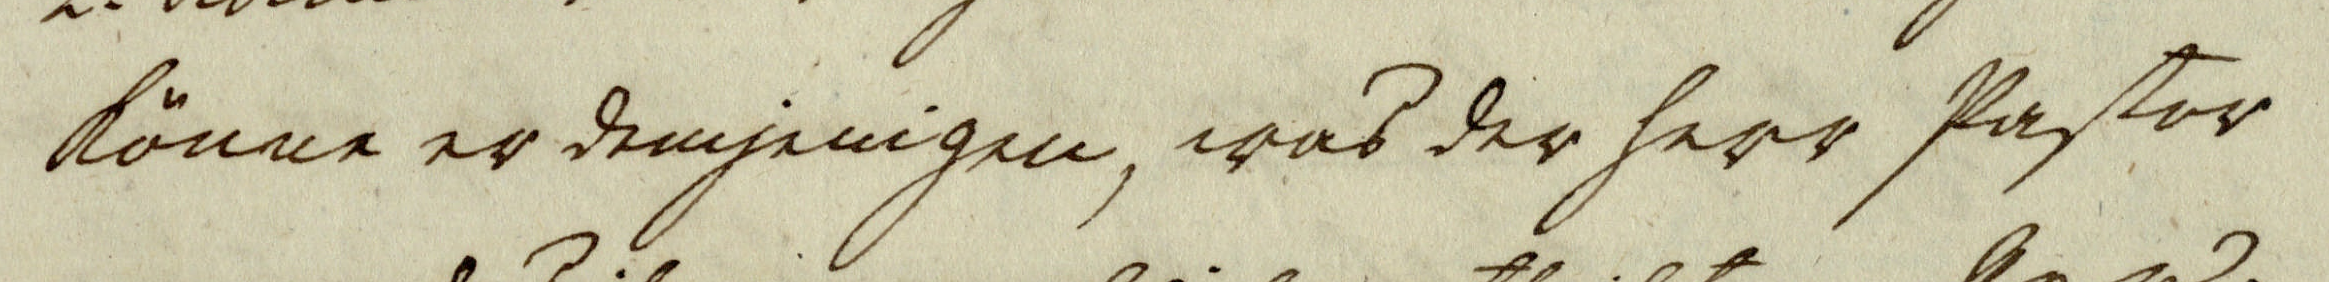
könne er demjenigen, was der Herr Pastor
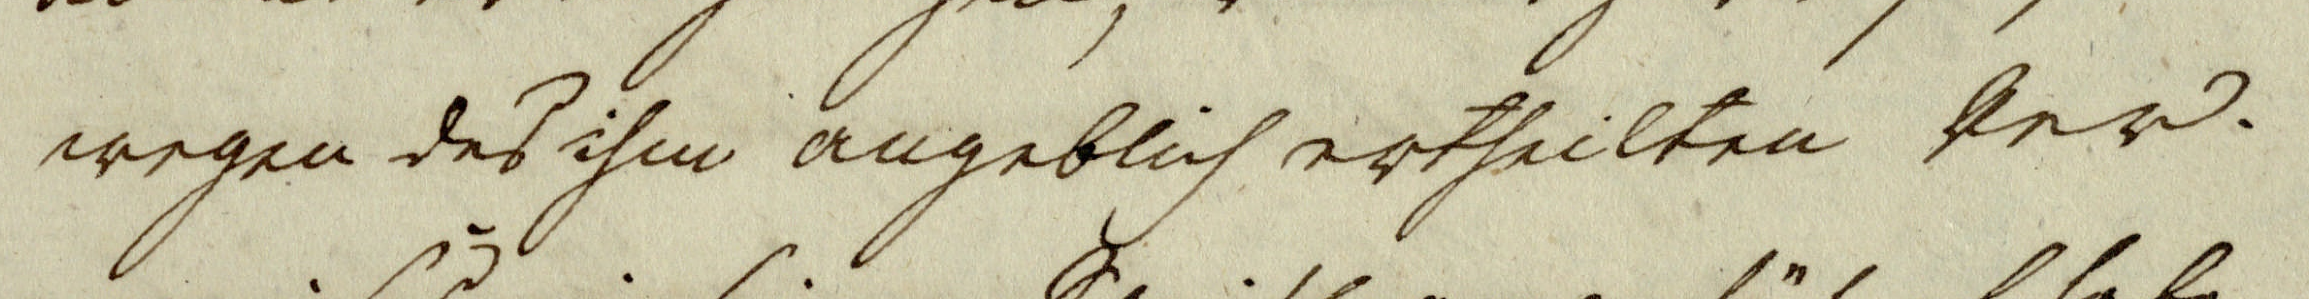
wegen des ihm angeblich ertheilten Ver¬
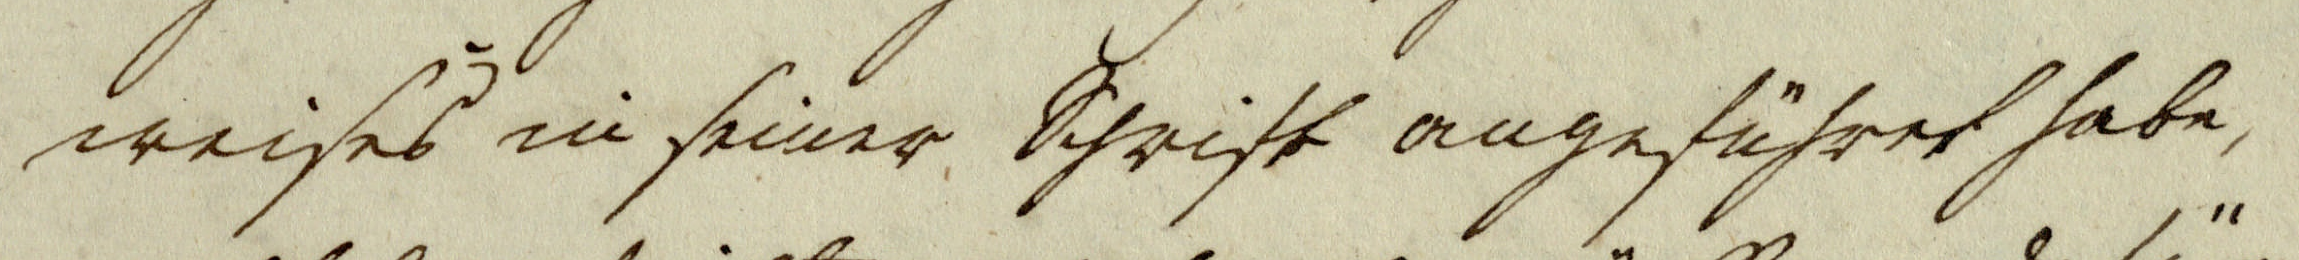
weises in seiner Schrift angeführet habe,
